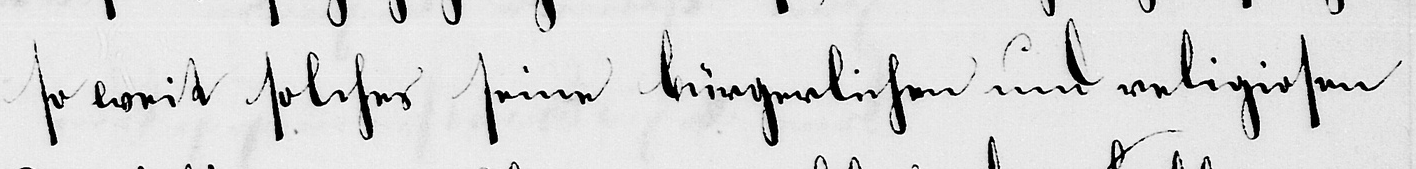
so weit solches seine bürgerlichen und religiosen
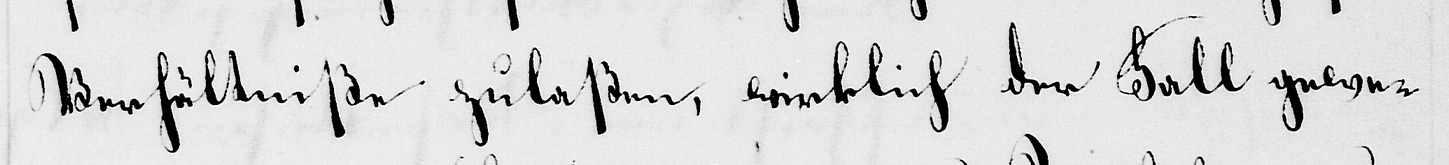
Verhältniße zulaßen, wirklich der Fall gewe¬
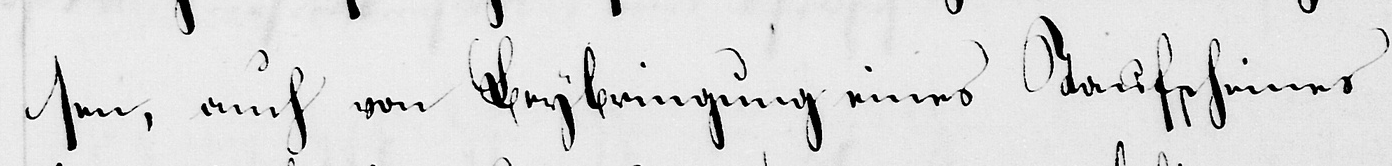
sen, auch von Beybringung eines Taufscheines
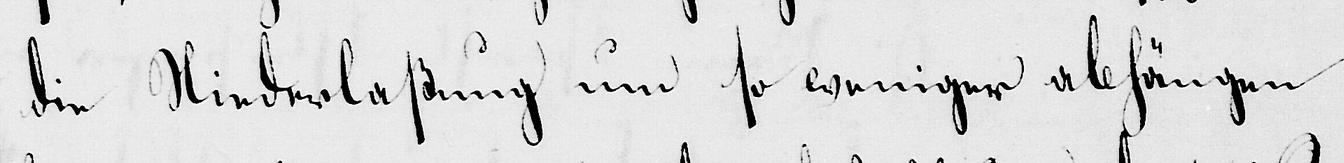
die Niederlaßung um so weniger abhängen
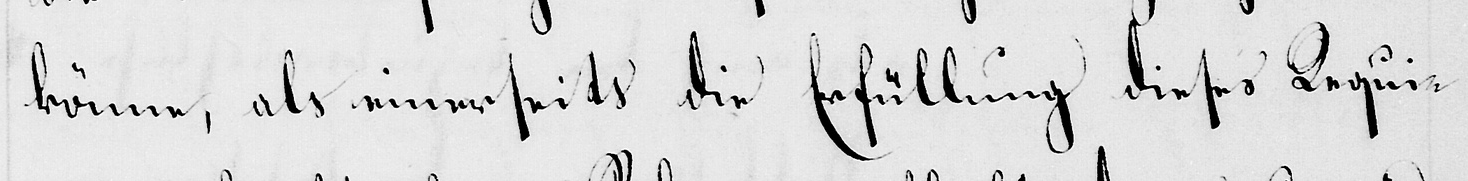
könne, als einerseits die Erfüllung dieses Requi¬
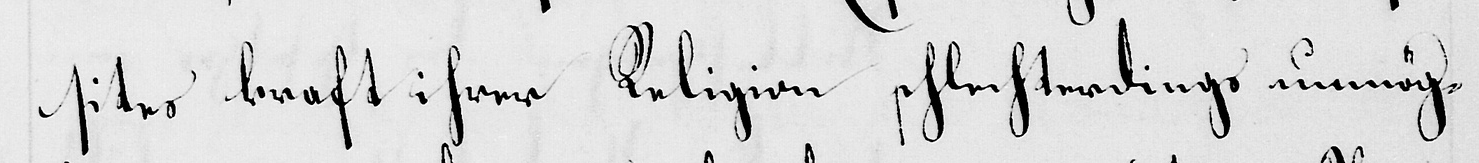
sites kraft ihrer Religion schlechterdings unmög¬
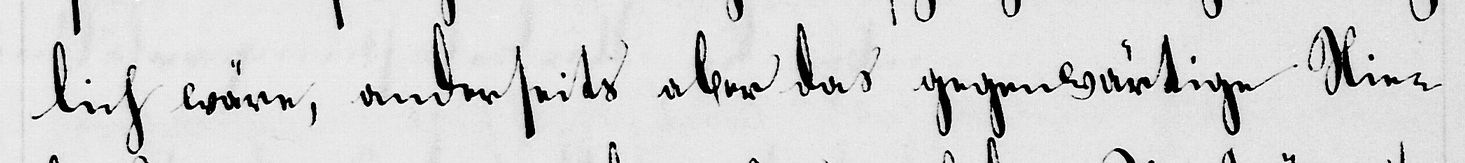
lich wäre, anderseits aber das gegenwärtige Nie¬
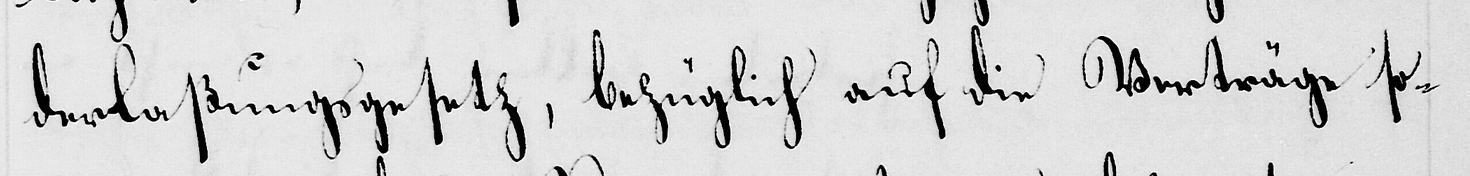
derlaßungsgesetz, bezüglich auf die Verträge so¬
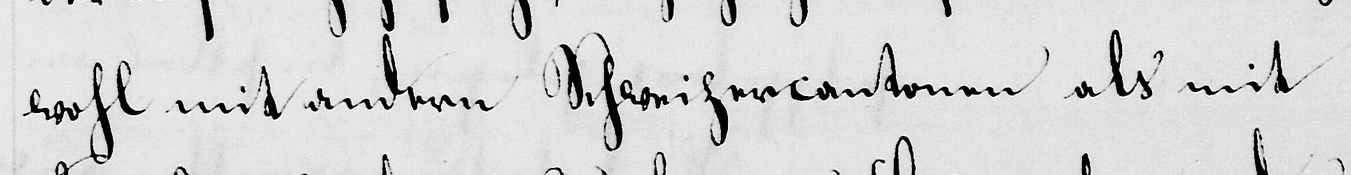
wohl mit andern Schweizercantonen als mit
